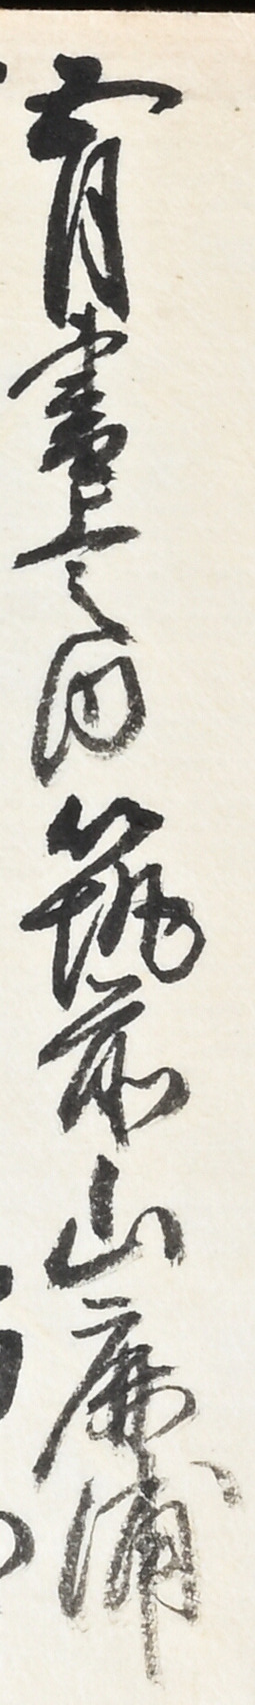五月書上之内筑前山鹿浦
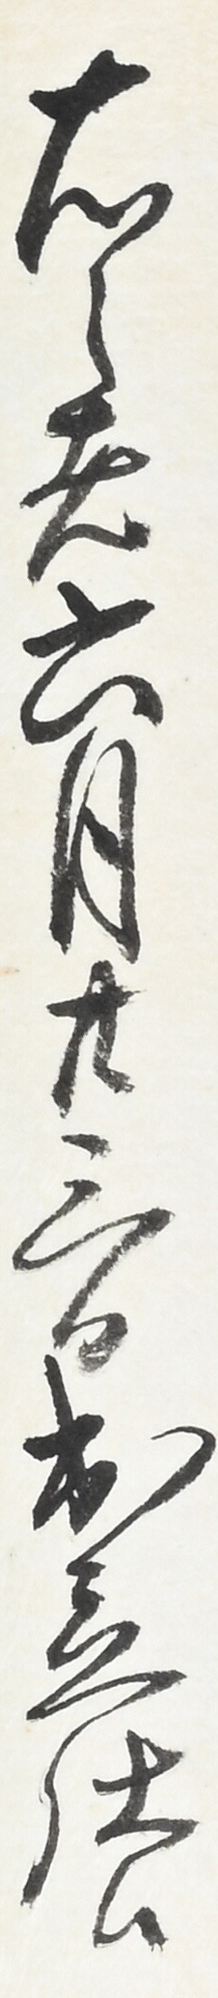右之者六月廿三日出立仕候
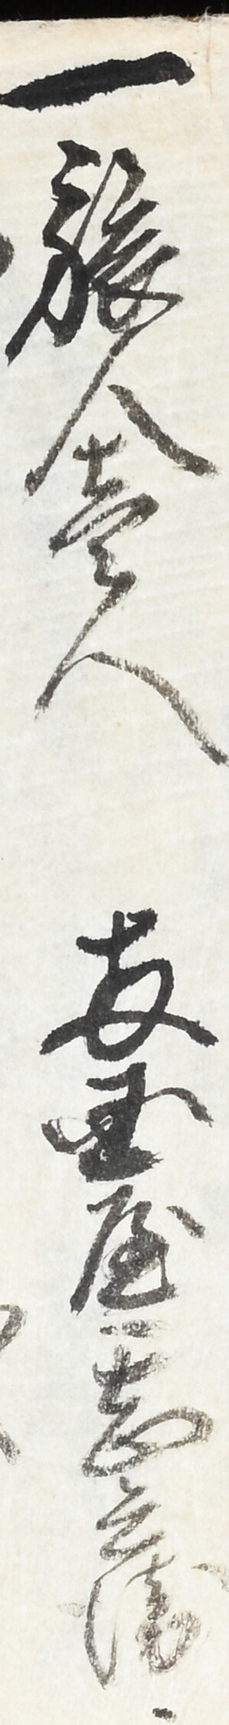一旅人壱人河内屋甚蔵・
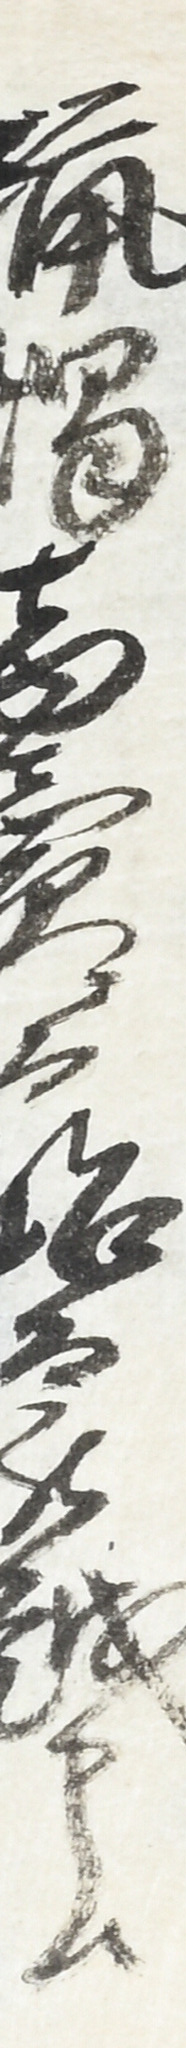薬商売ニ而始而罷越申候

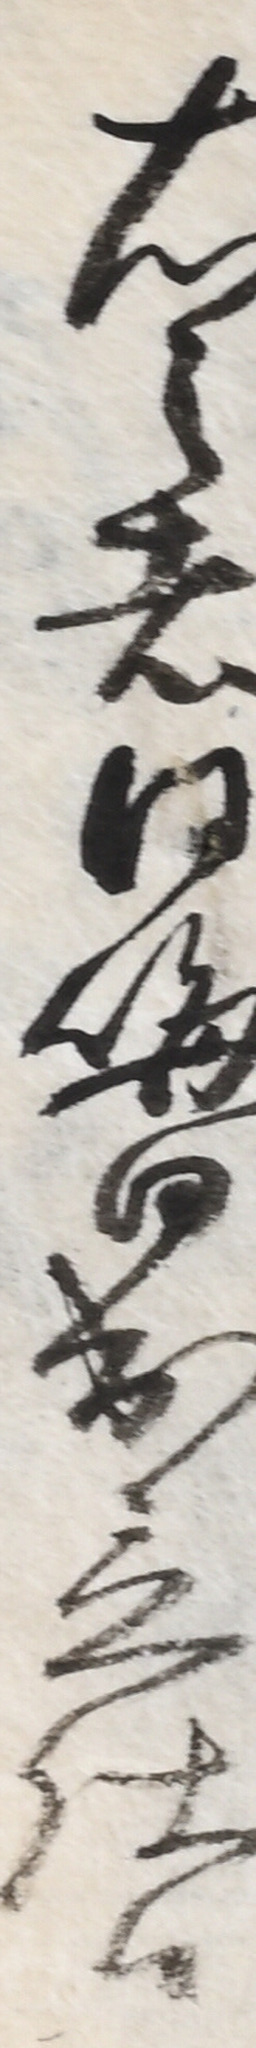右之者同廿肋日出立仕候
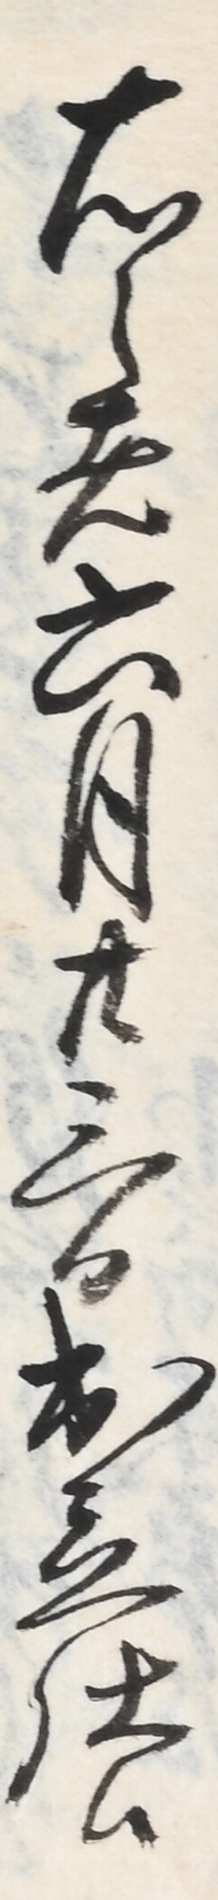右之者六月廿八日出立仕候
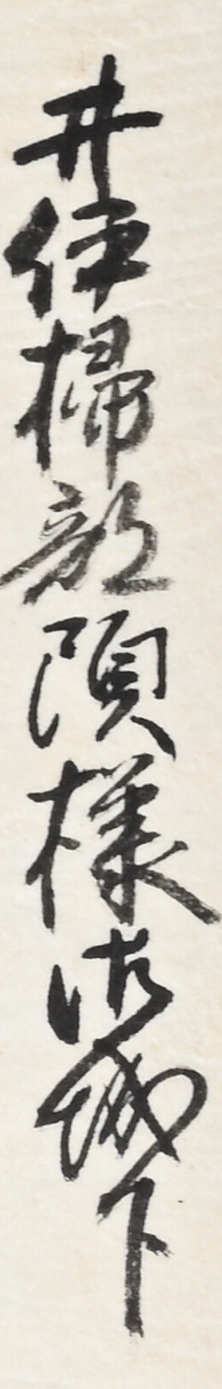井伊掃部頭様御城下
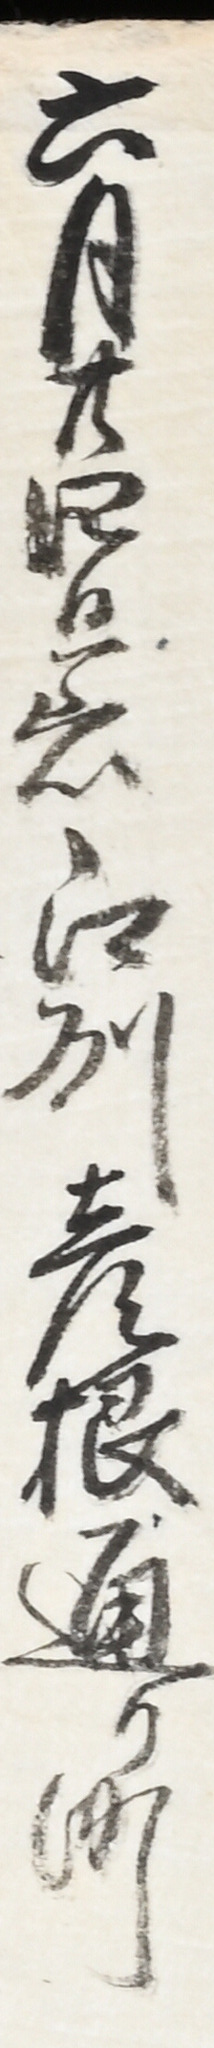六月廿四日着江州彦根通り町
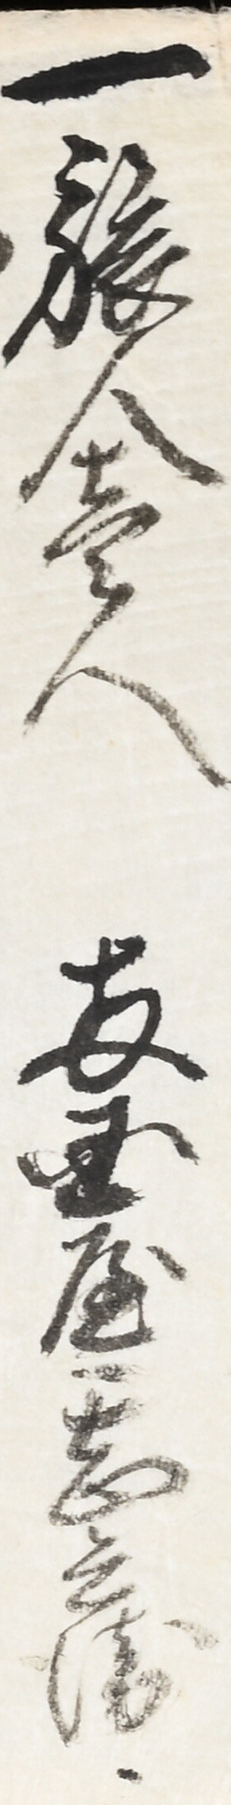一旅人壱人両国屋甚兵衛・
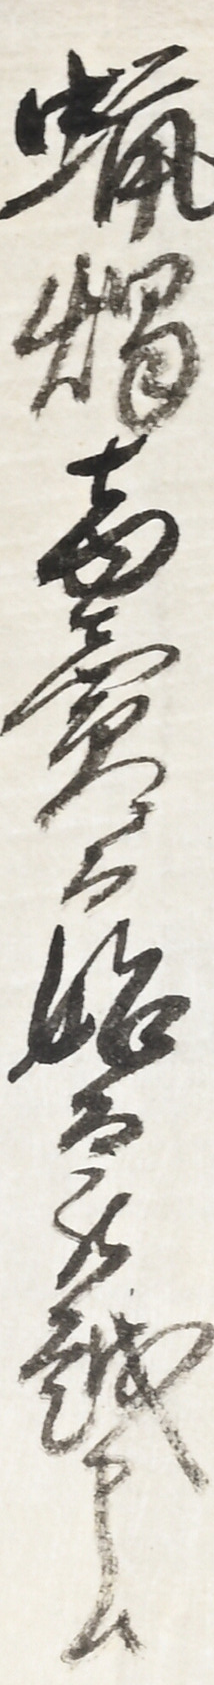蝋燭商売ニ而始而罷越申候
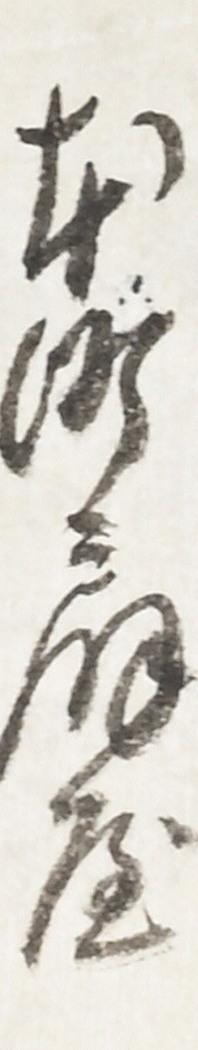本町扇屋
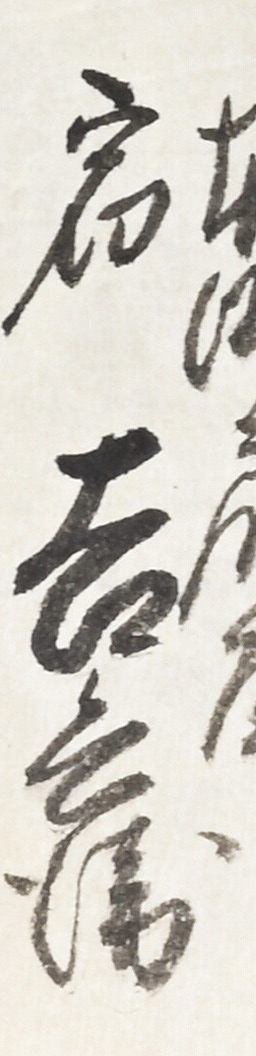宿吉兵衛
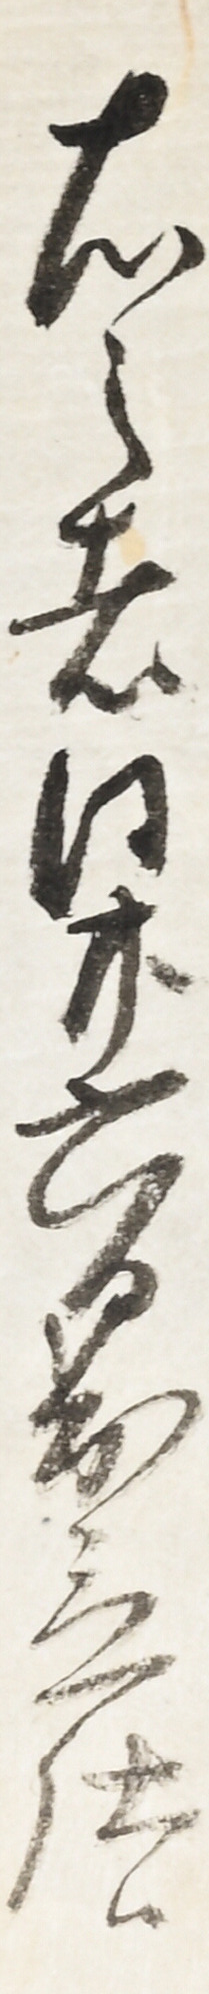右之者同廿肋日出立仕候
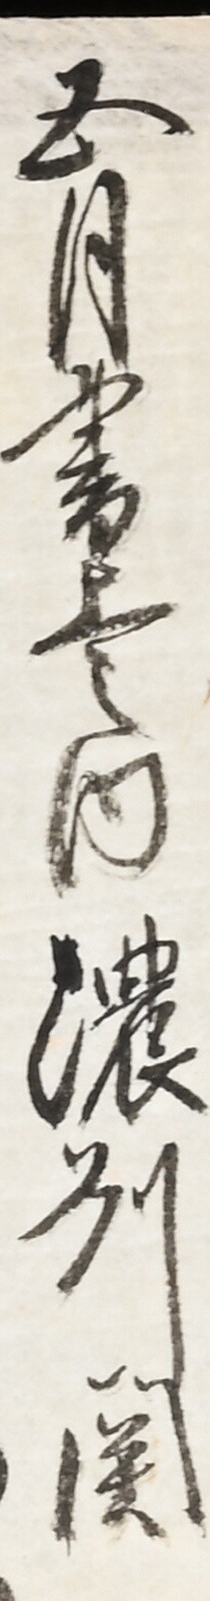五月書上之内濃州関
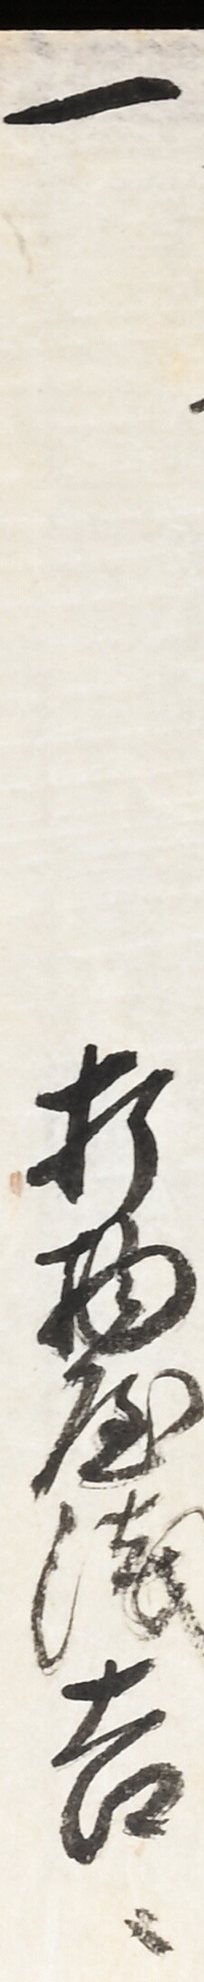一打物屋浅吉・
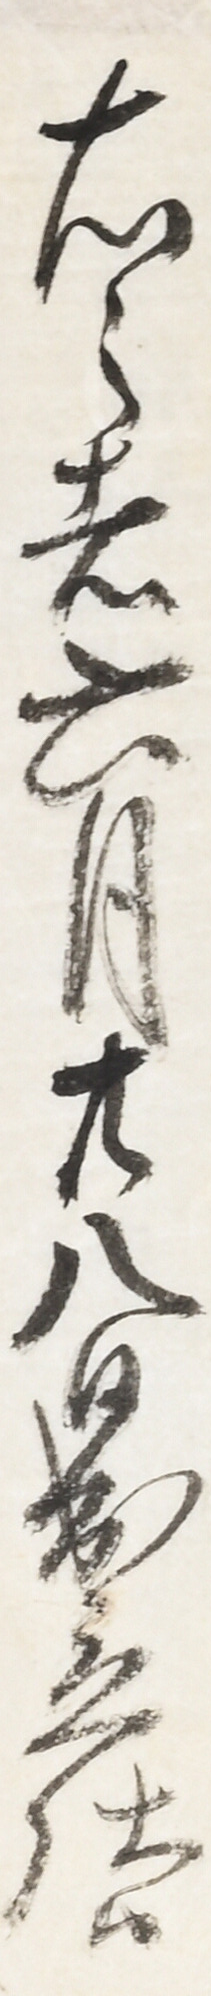右之者六月廿八日出立仕候
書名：旅人泊控帳
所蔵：伊那市立高遠町図書館・合同会社AMANE
